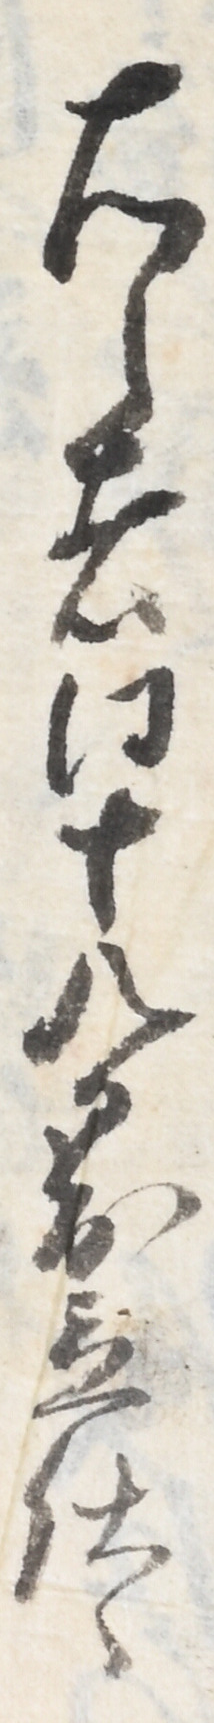右之者同十五日出立仕候
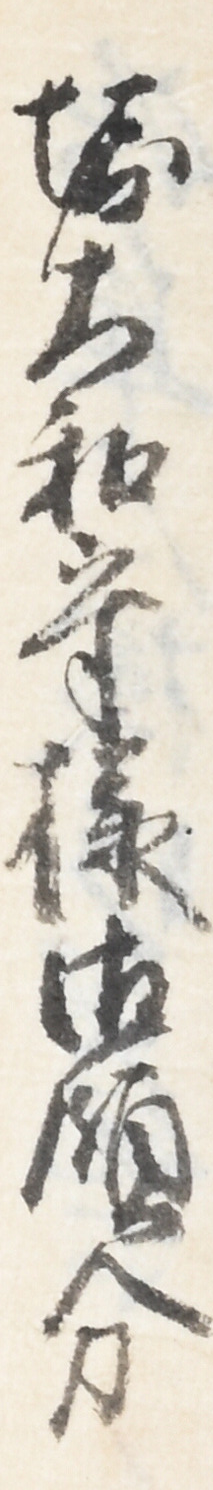朽木大隅守様御領分
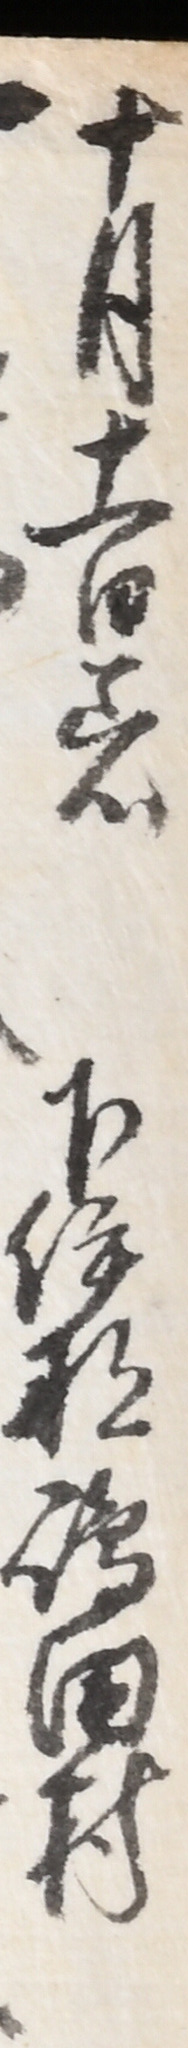十月十一日着下伊嶋田村
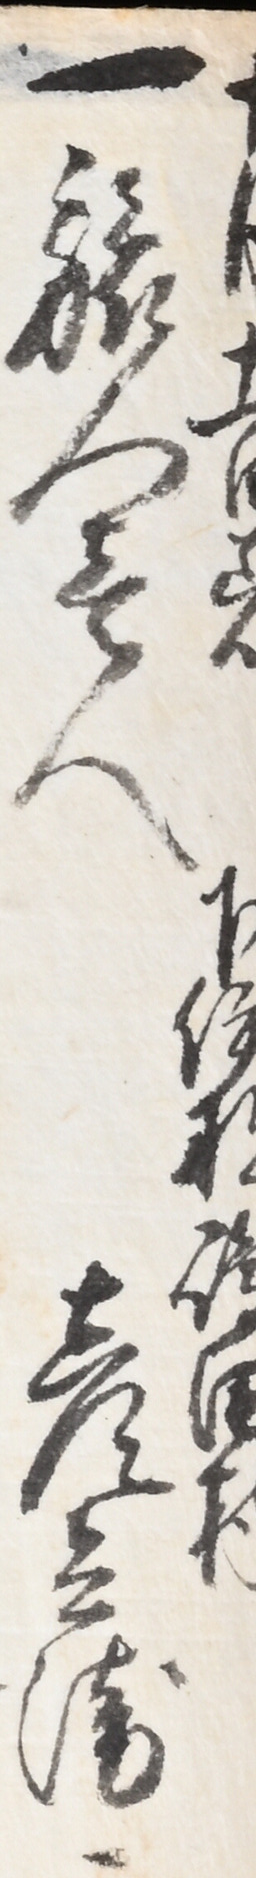一旅人壱人彦兵衛・
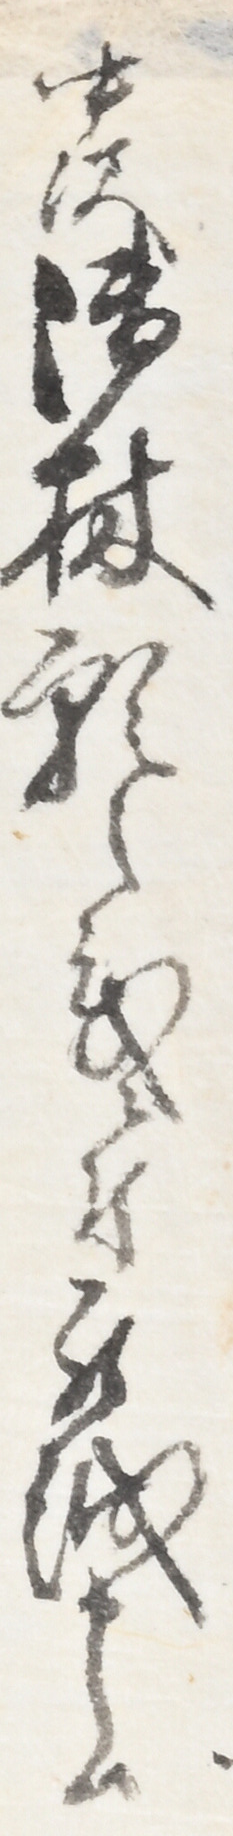中沢御林願之義ニ付罷越申候
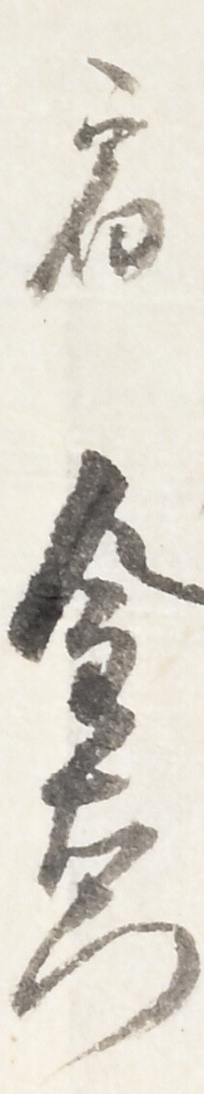宿金右衛門
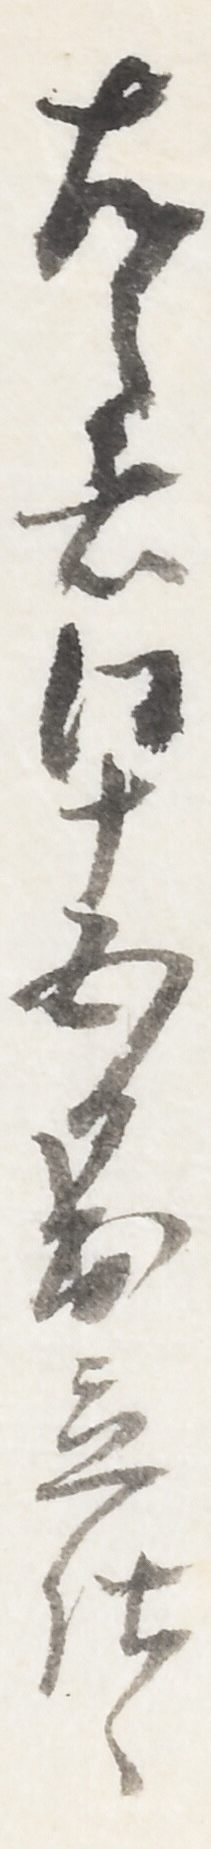右之者同十五日出立仕候
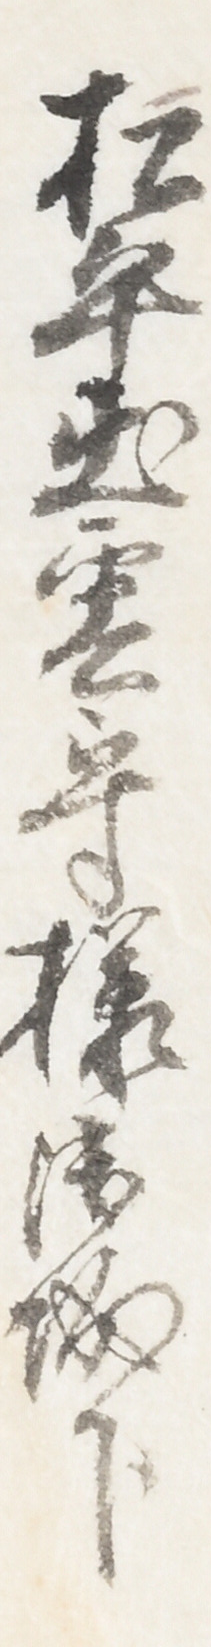松平出雲守様御城下
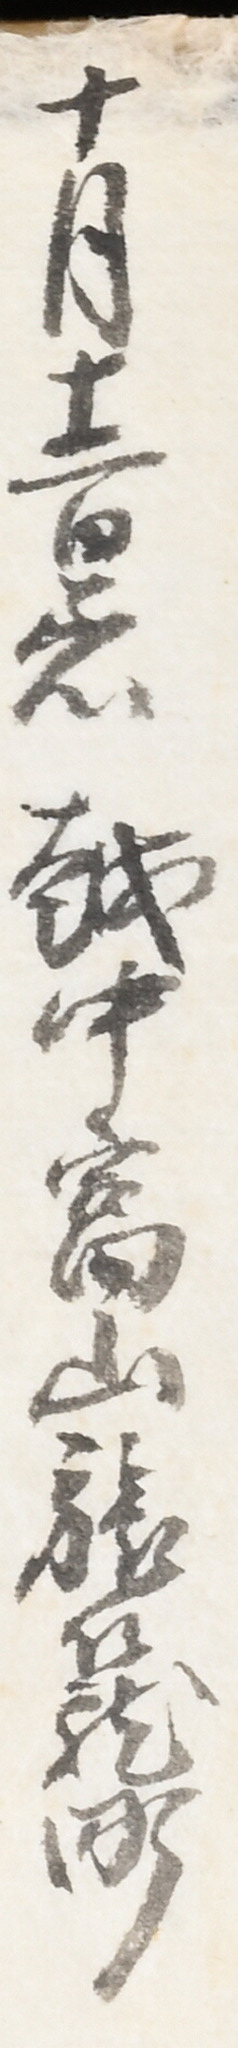十月十二日着越中富山旅籠町
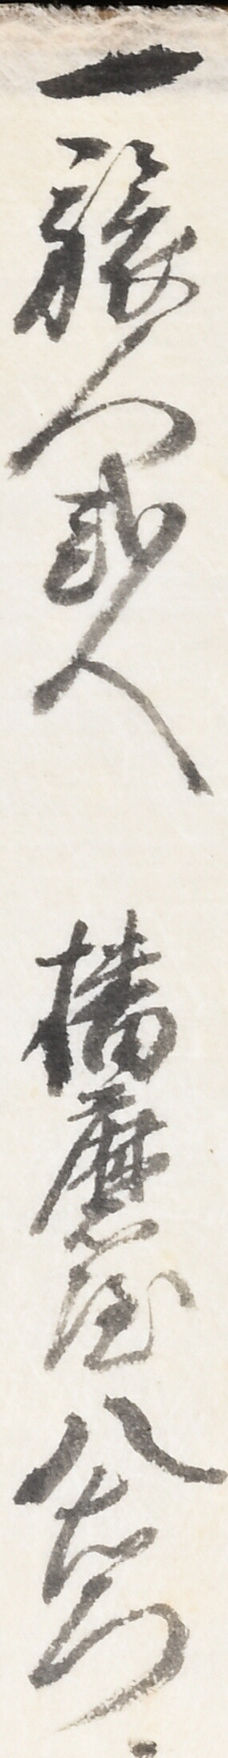一旅人弐人播磨屋八右衛門・
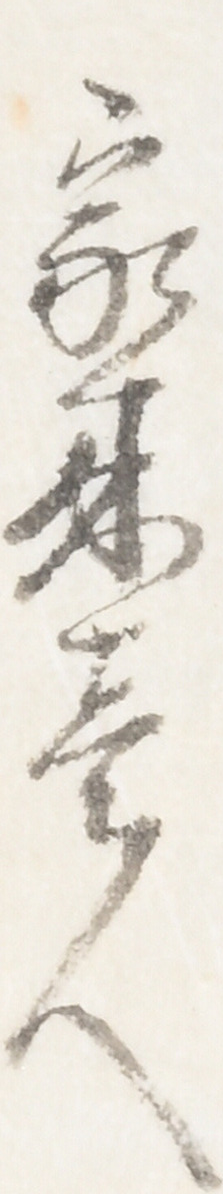家来壱人
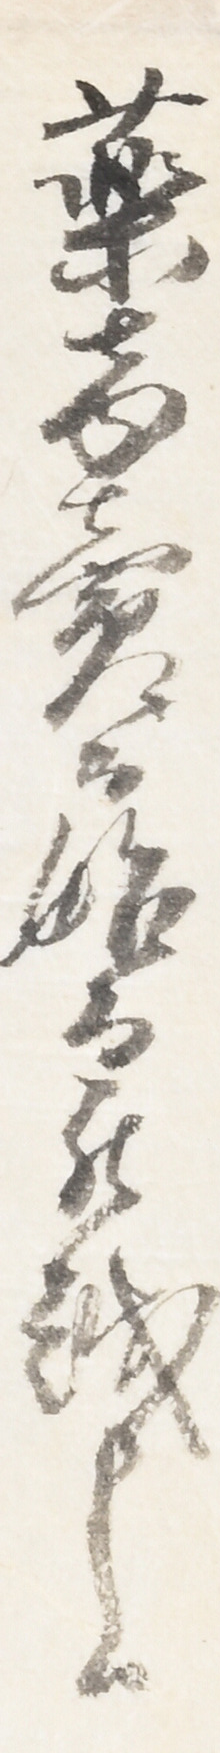薬商売ニ而始而罷越申候
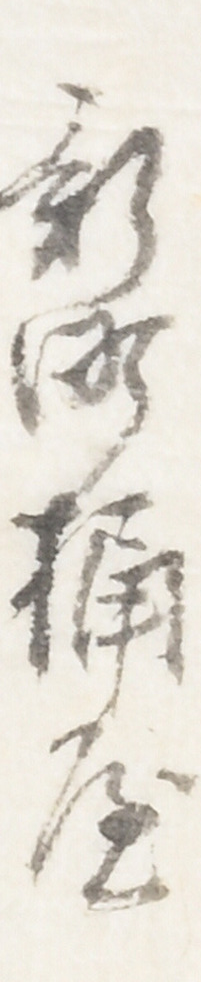新町桶屋
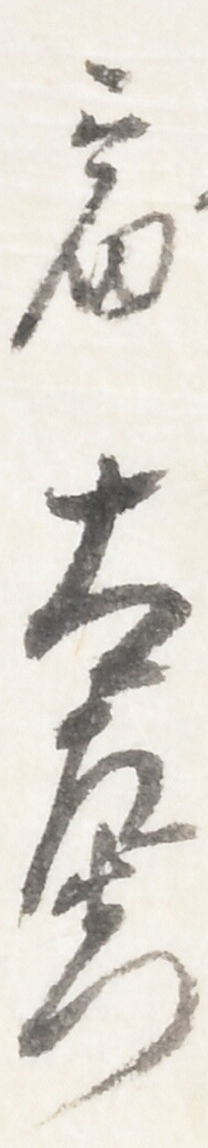宿太左衛門
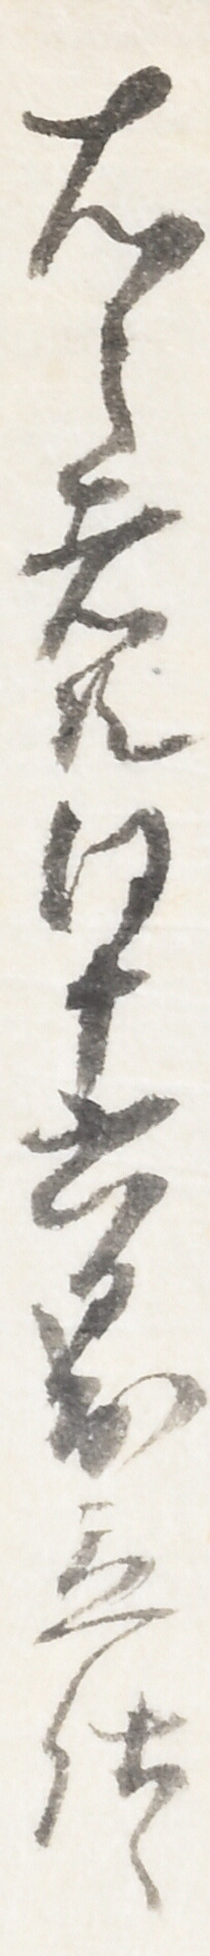右之者共同十六日出立仕候
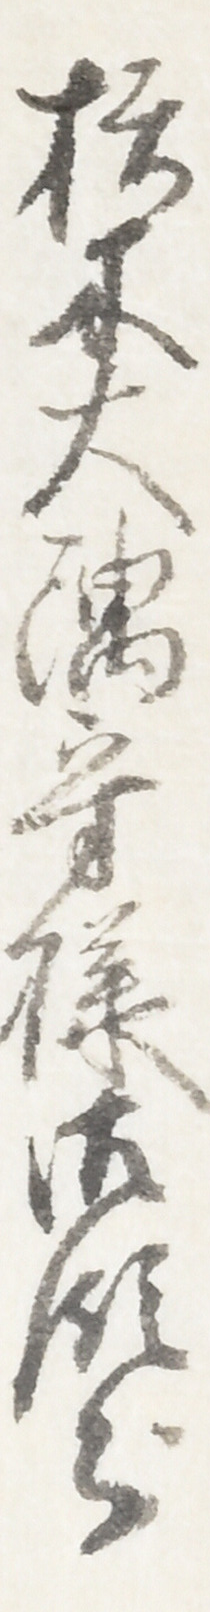朽木大隅守様御領分
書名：旅人泊控帳
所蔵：伊那市立高遠町図書館・合同会社AMANE
